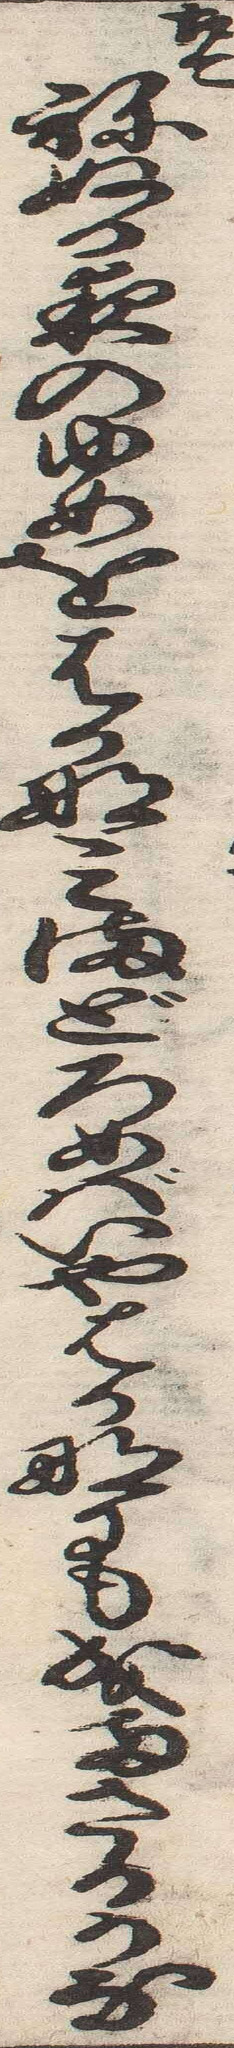古今ねぬる夜のゆめをはかなみまどろめばいやはかなにも成まさるかな
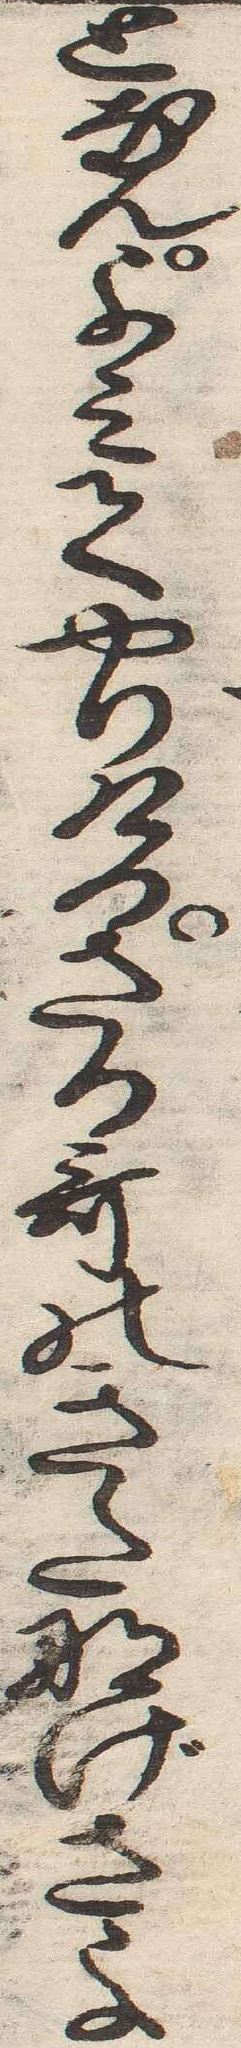となん。よみてやりける。さる哥のきたなげさよ
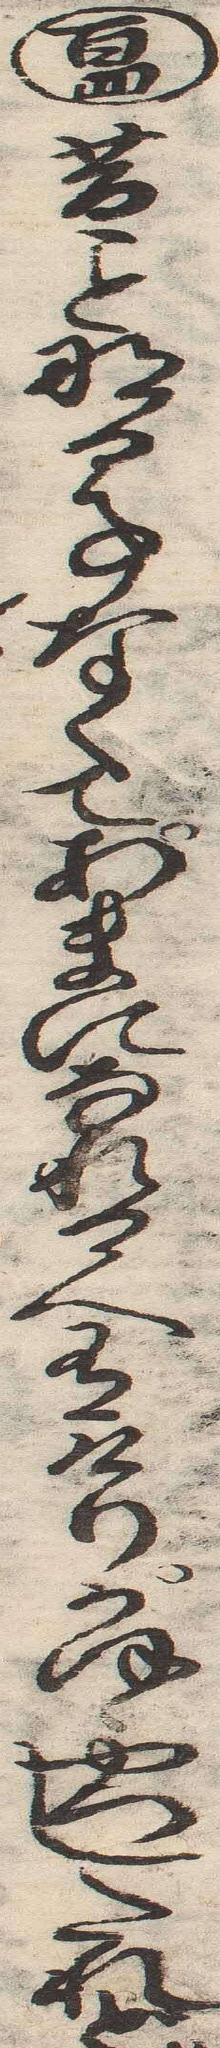百四昔ことなる事なくて。あまになれる人有けり。かほやつしたれど。
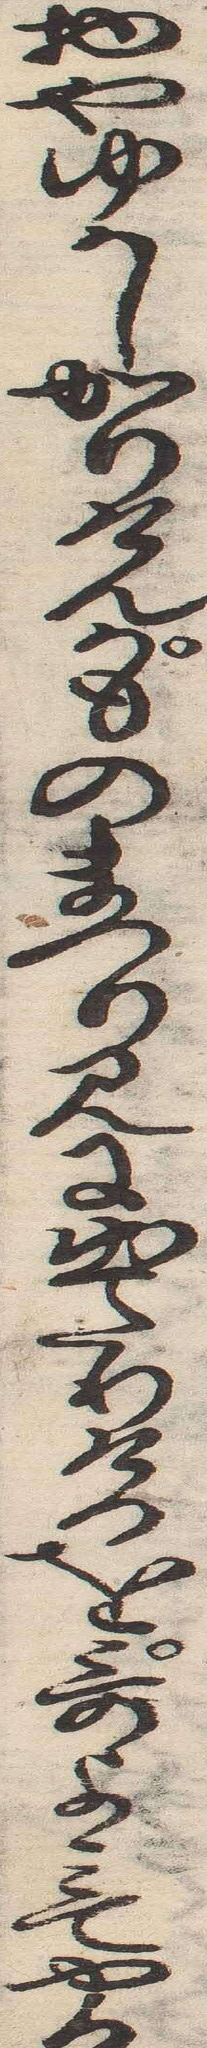物やゆかしかりけん。かものまつり見に出たりけるを。哥よみてやる

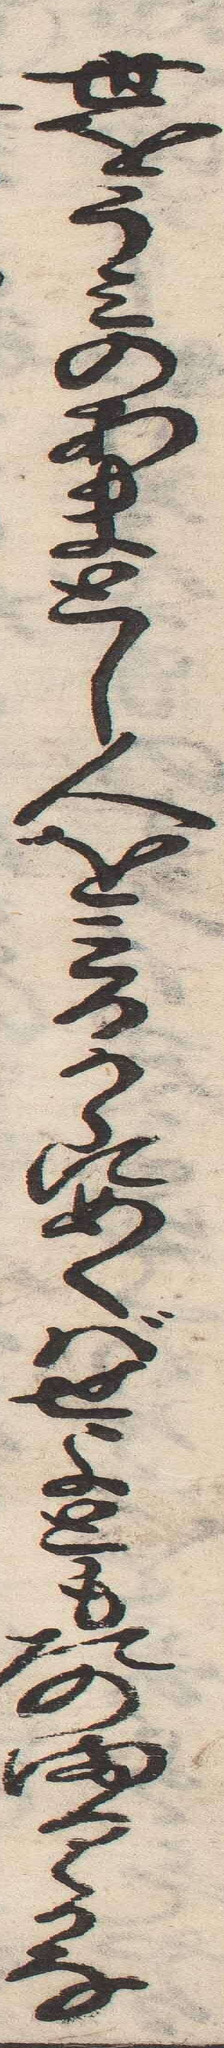世をうみのあまとし人をみるからにめくばせよともたのまるゝかな
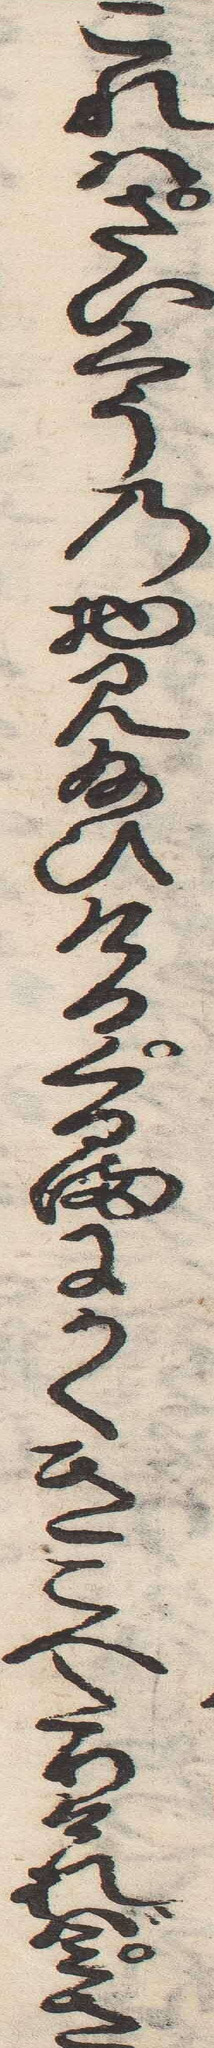これは。さいくうの物見給ひける。くるまにかくきこへたりければ。みさ
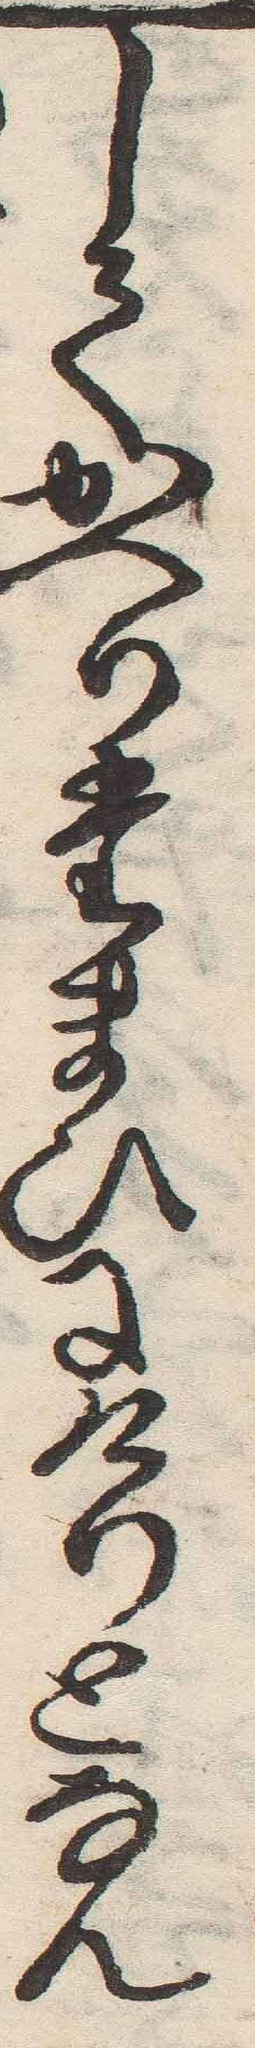してかへりたまひにけりとなん
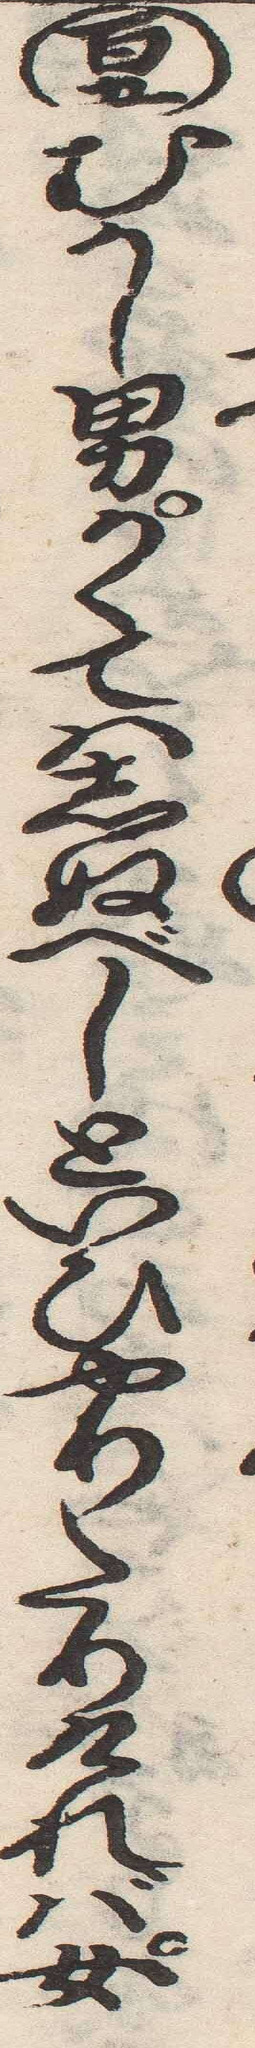百五むかし男。かくてはしぬべしといひやりたりければ。女
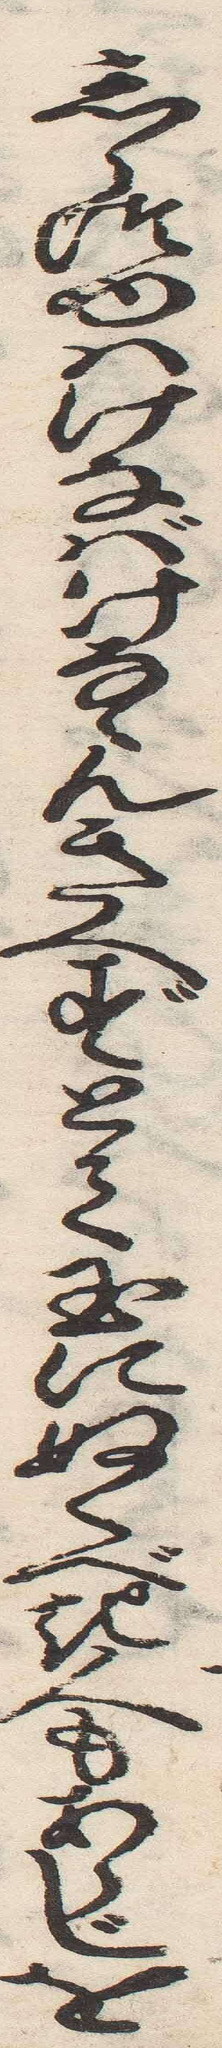しらつゆはけなばけなゝんきへずとて玉にぬくべき人もあらじを
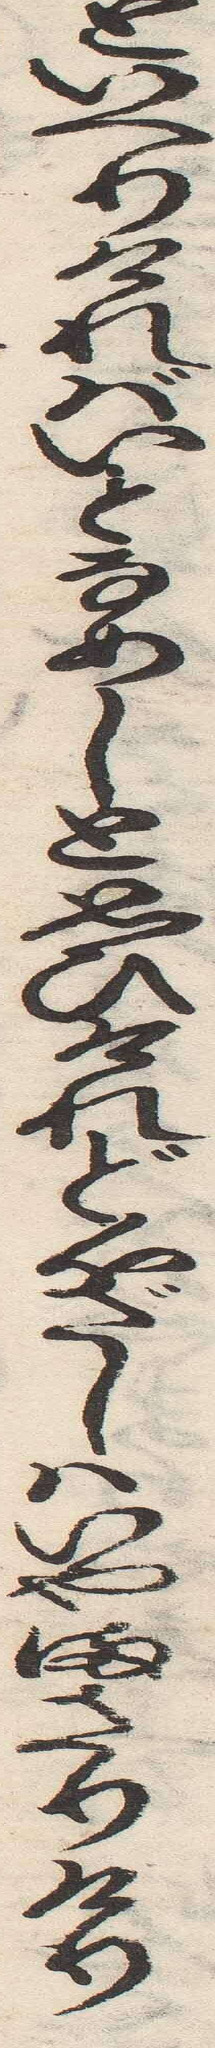といへりければいとなめしと思ひけれど心ざしはいやまさりけり
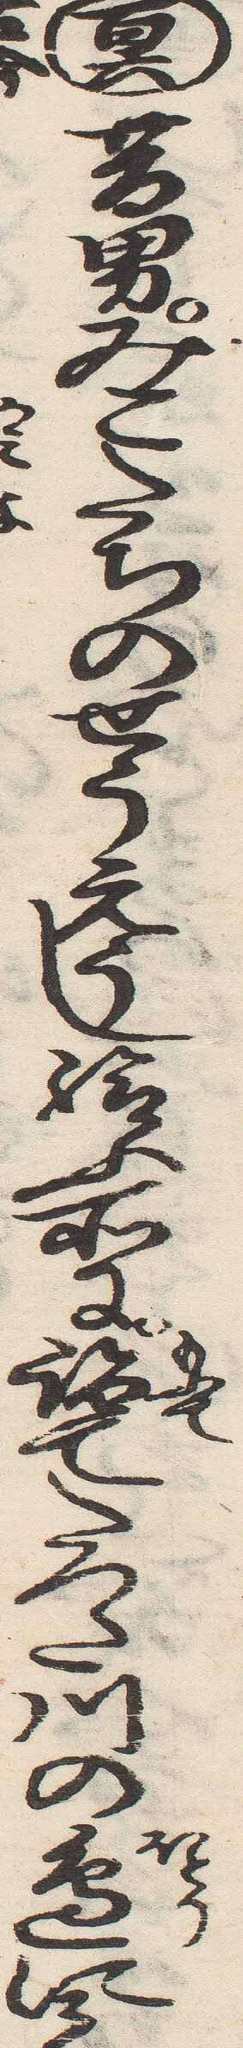百六昔男。みこたちのせうえうし給ふ所に。詣てたつた川の辺にて
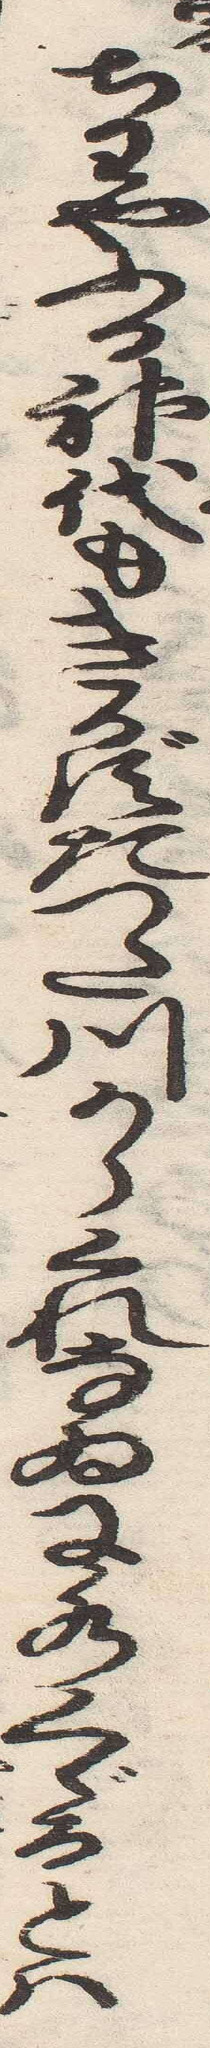古今ちわやふる神代もきかずたつた川からくれなゐに水くゞるとは
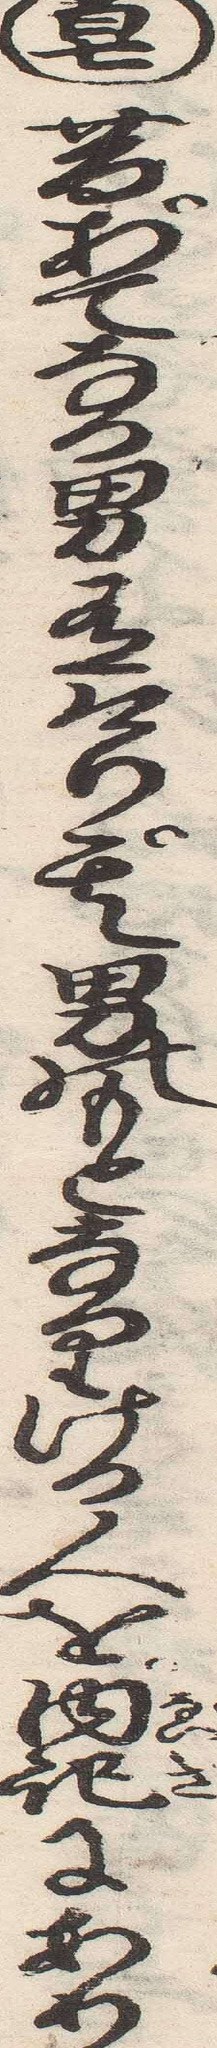百七昔。あてなる男有けり。其男のもとなりける人を。内記にあり
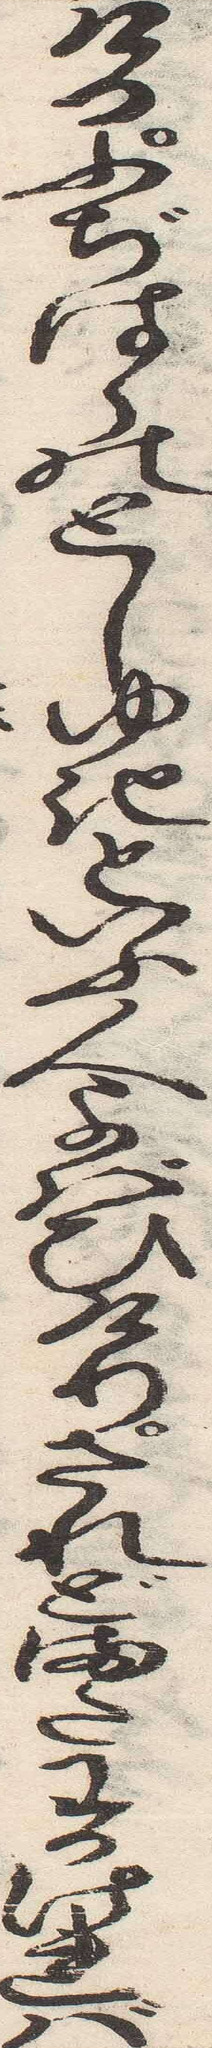ける。ふじはらのとしゆきといふ人よばひけり。されどまたわかければ
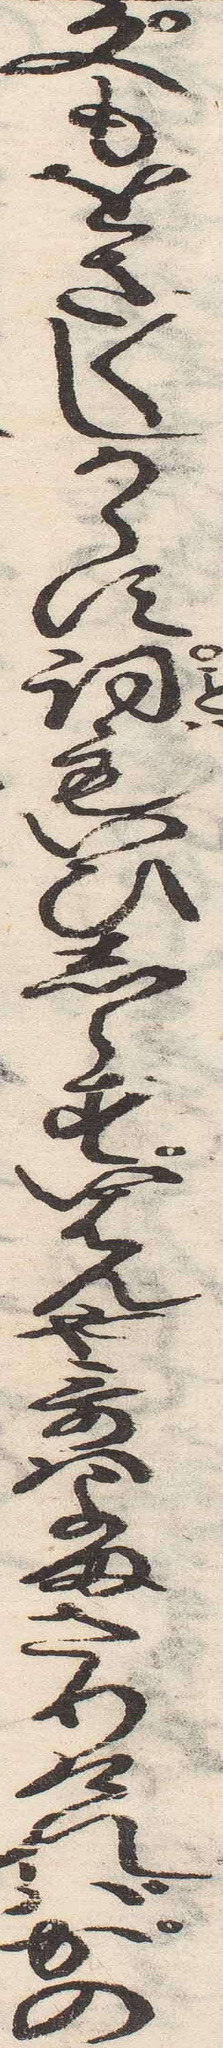。文もをさ〳〵しからす。詞もいひしらす。いはんや哥はよまさりければ。かの
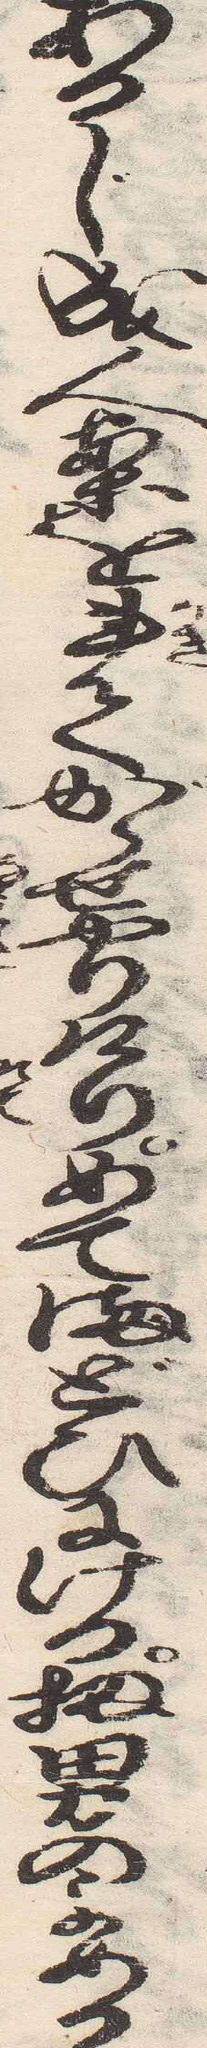あるし成人案を書て。かゝせやりけり。めてまどひける。扨男のよめる
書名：伊勢物語
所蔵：東京学芸大学附属図書館 国文学研究資料館
